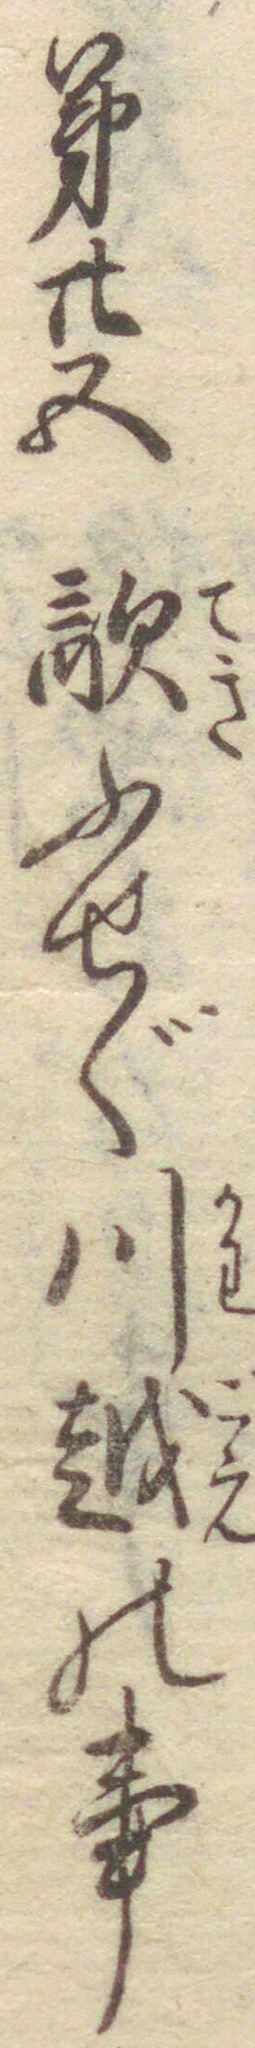第廿五敵ふせぐ川越の事
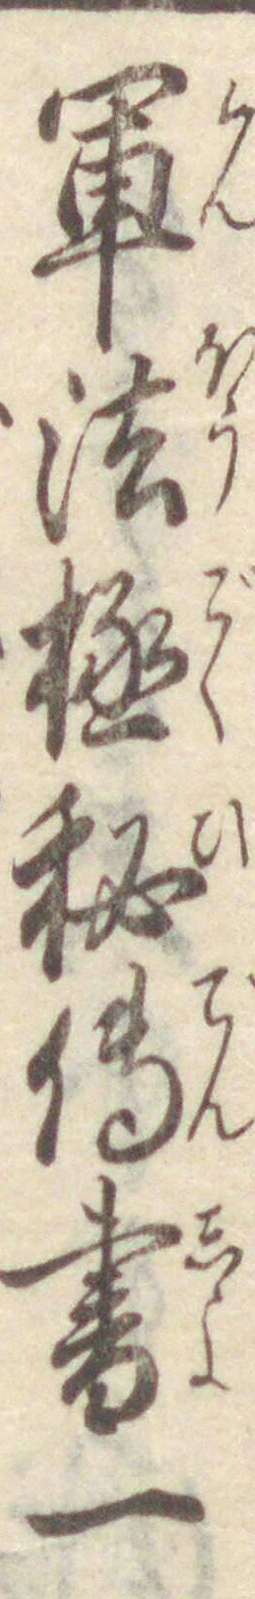軍法極秘伝書一
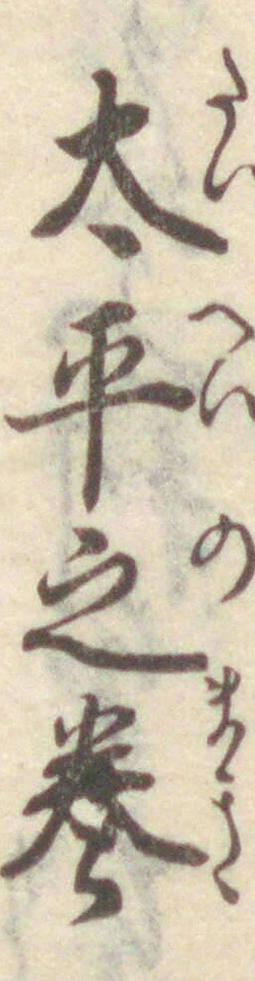太平之巻
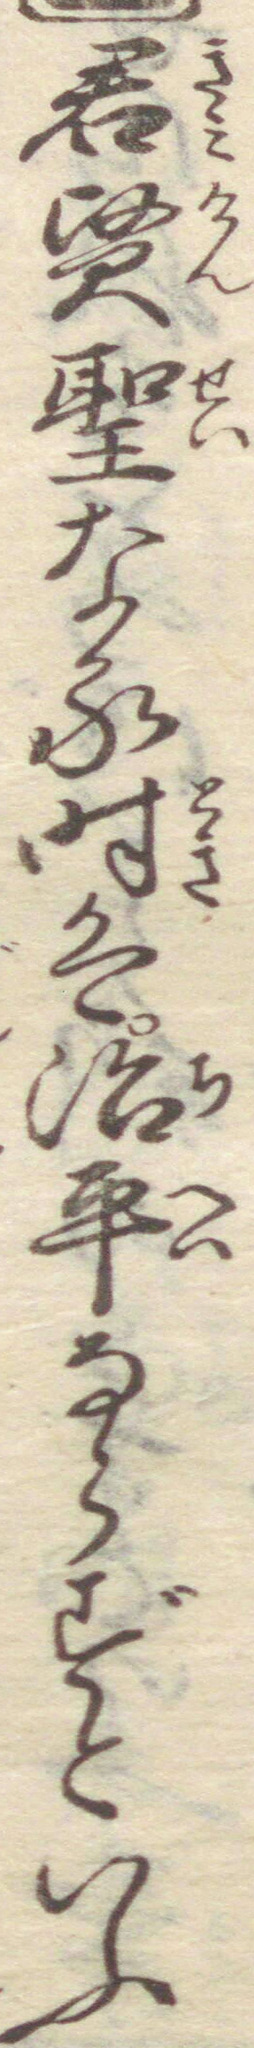一君賢聖なる時は。治平ならずといふ
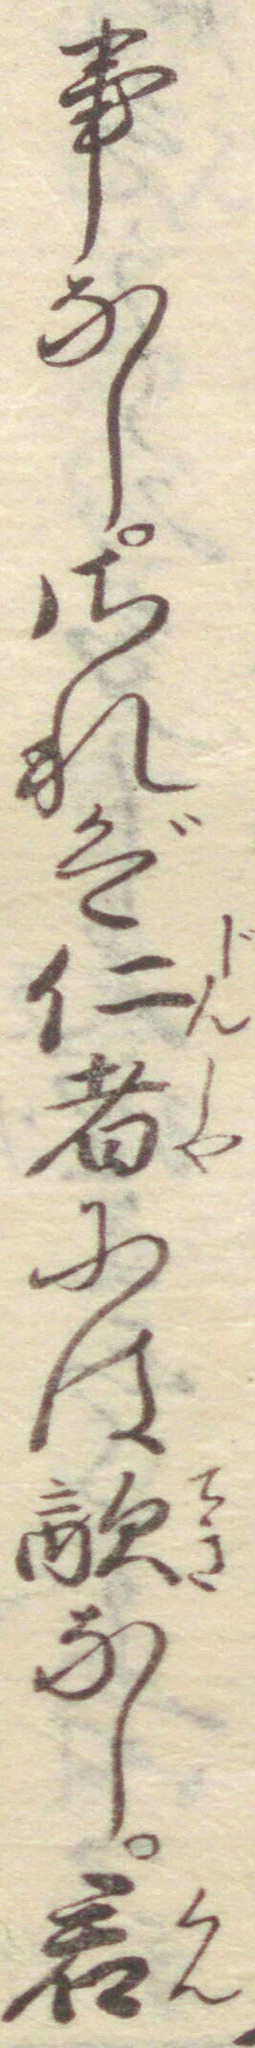事なし。されば仁者には敵なし。君
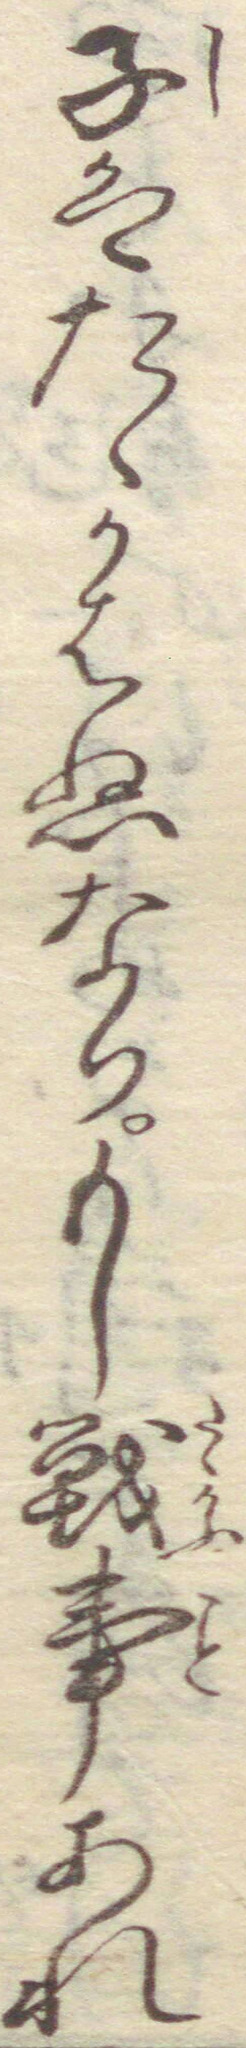子はたゝかはぬなり。もし戦事あれ
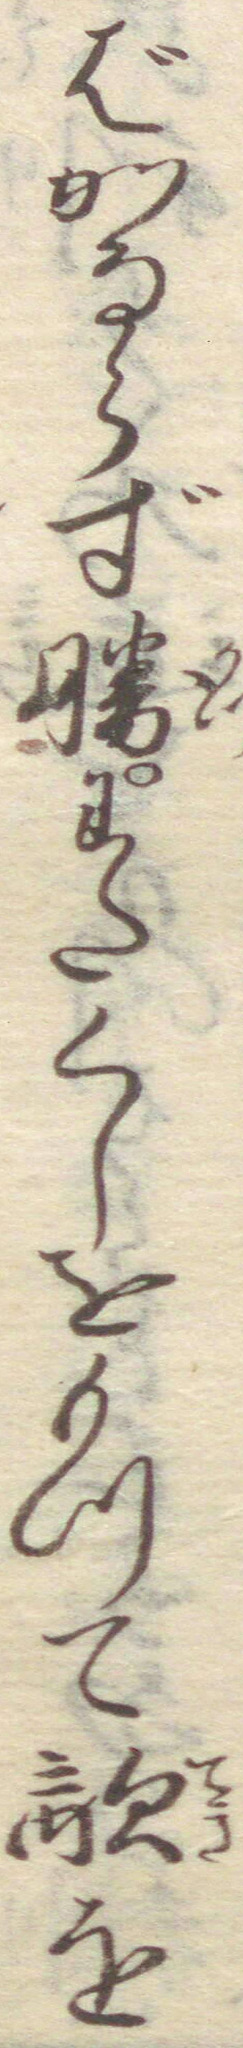ばかならず勝。わたくしをもつて敵を
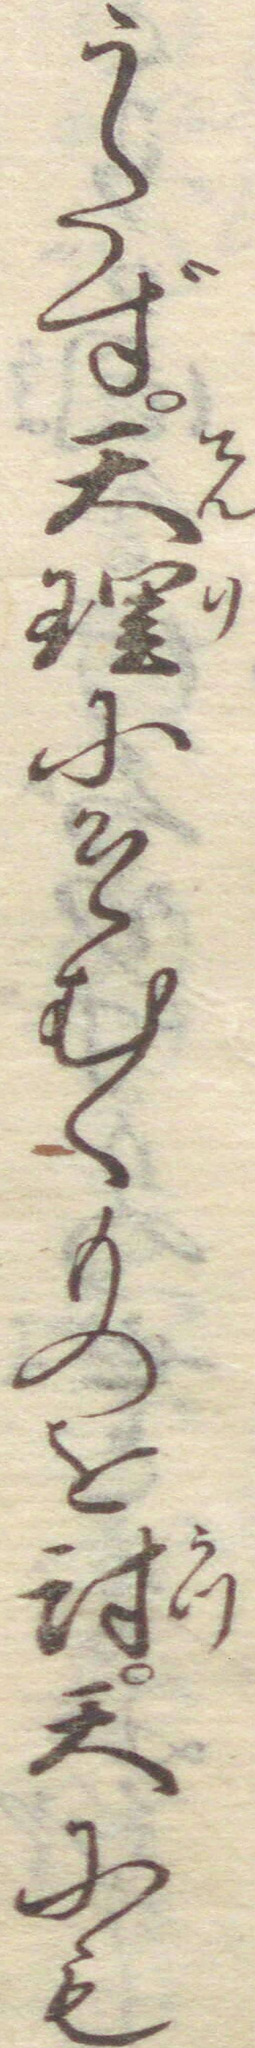うたず。天理にそむくものを討。天にも
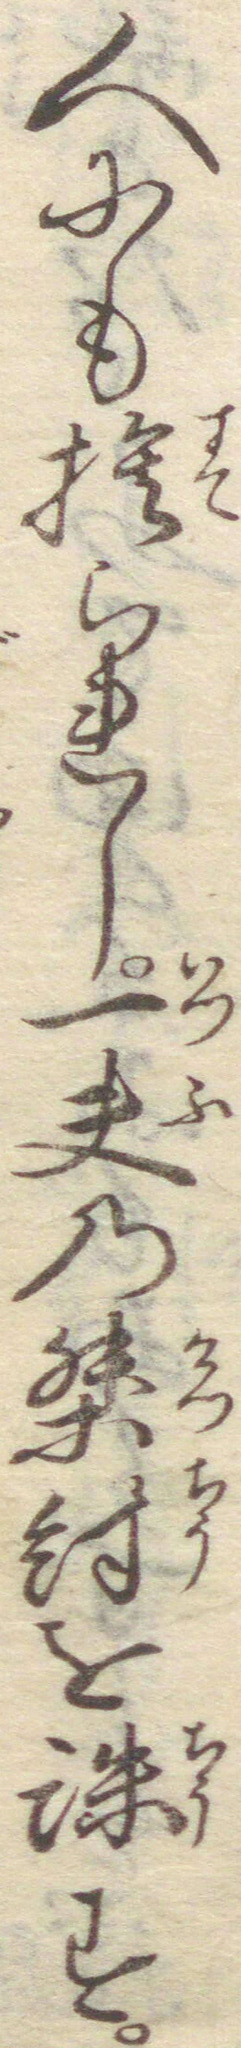人にも捨られし。一夫の桀紂を誅す。
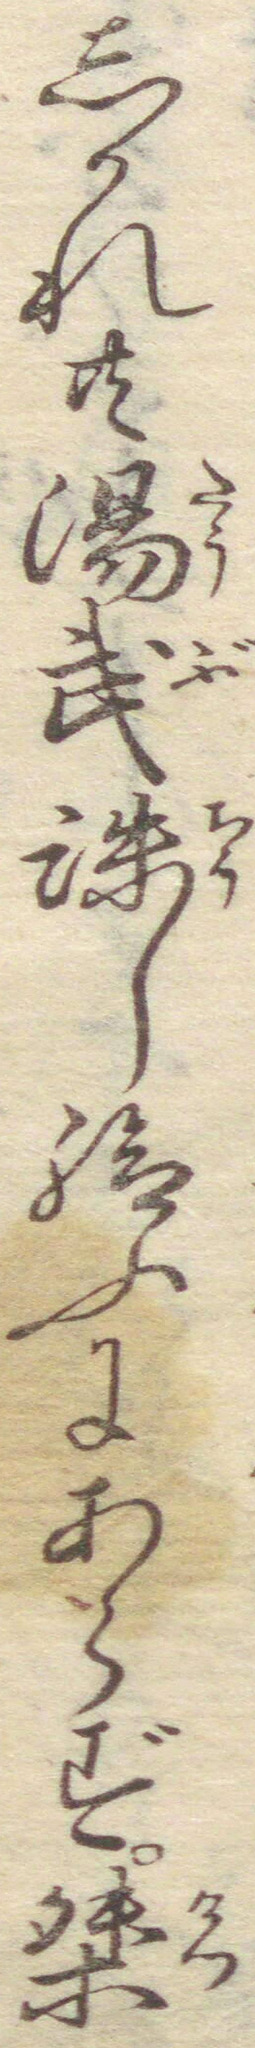しかれ共湯武誅し給ふにあらず。桀
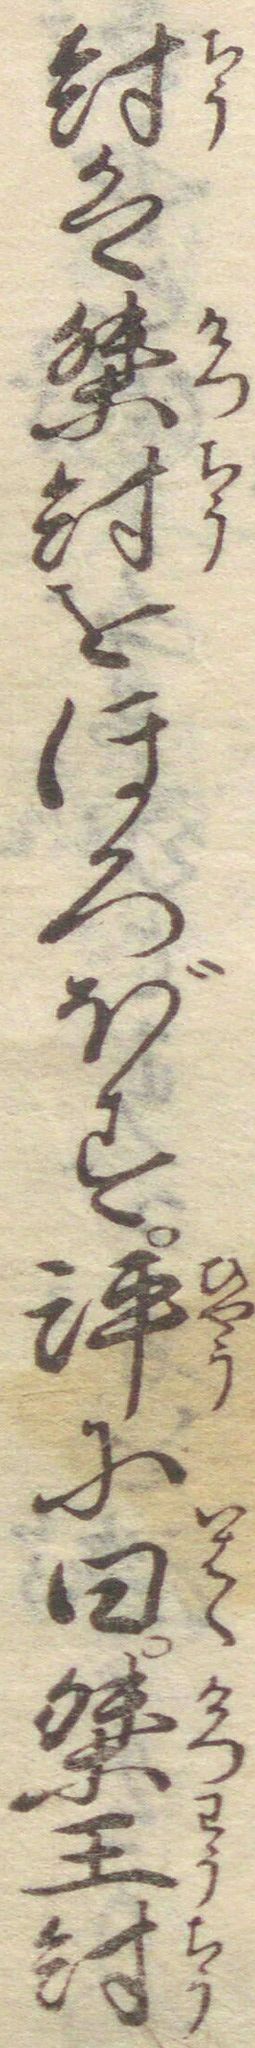紂は桀紂をほろぼす。評に曰。桀王紂

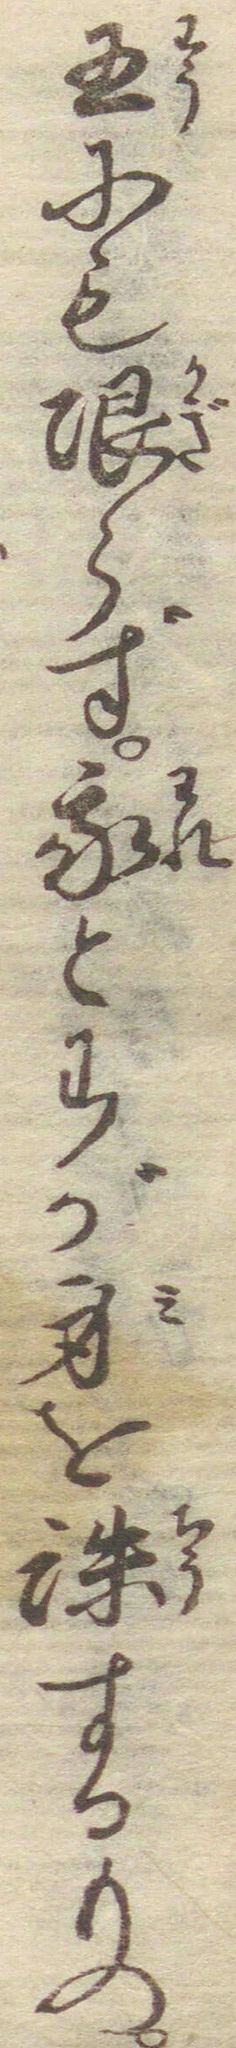王にも限らず。我とわが身を誅するもの。
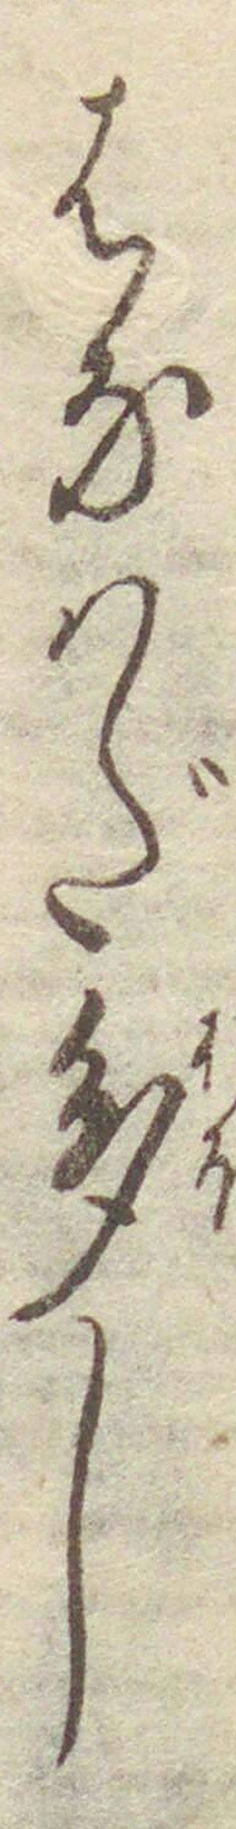はなはだ多し
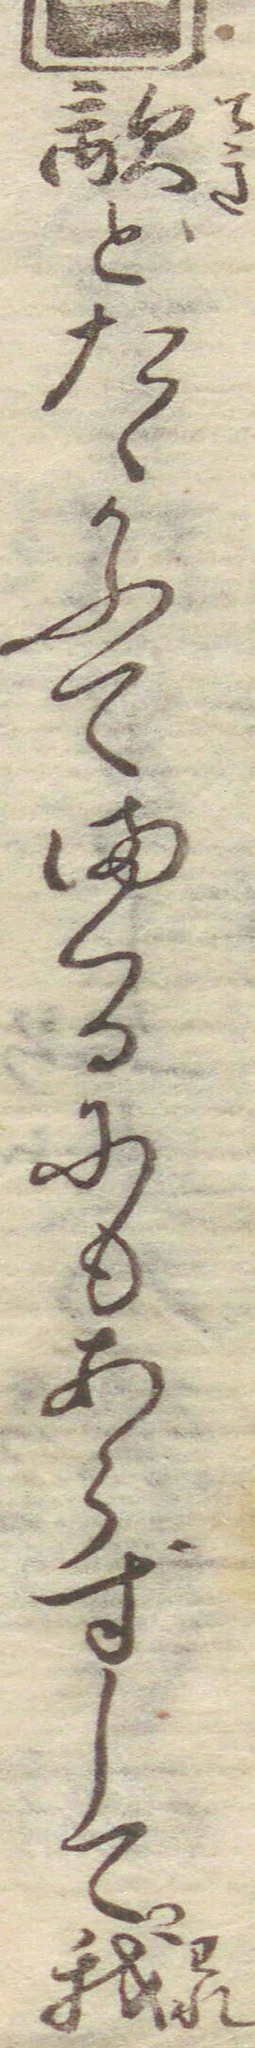二敵とたゝかふてまくるにもあらずして。我
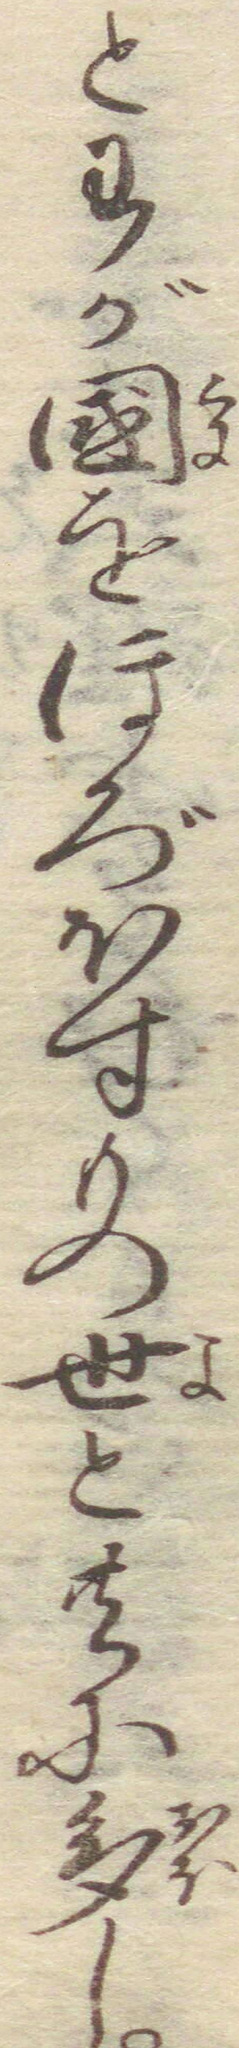とわが国をほろ＃ぼすもの世と共に多し。
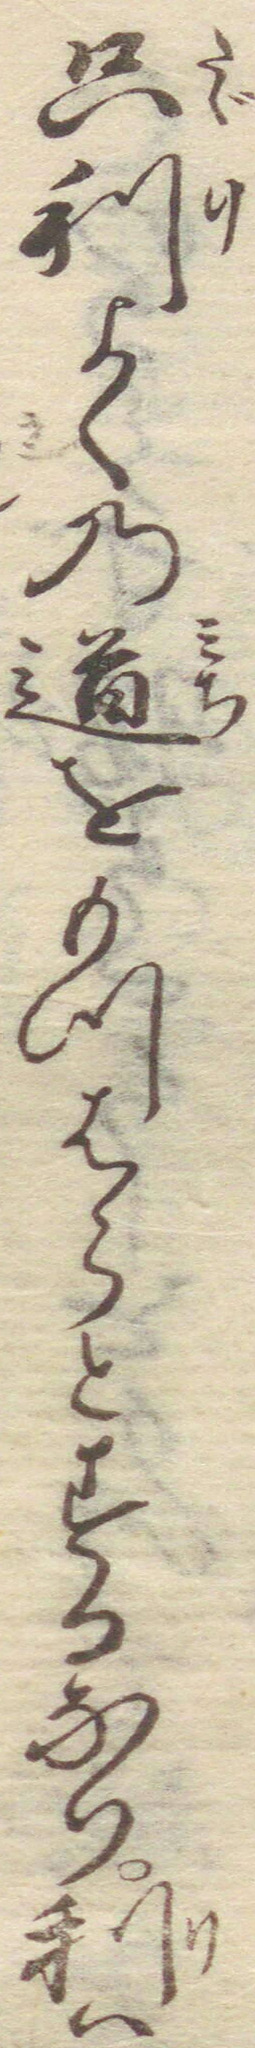只利よくの道をもつはらとするなり。利は
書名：軍法極秘傳書
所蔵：国文学研究資料館
